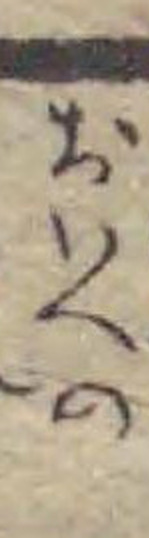おいへの
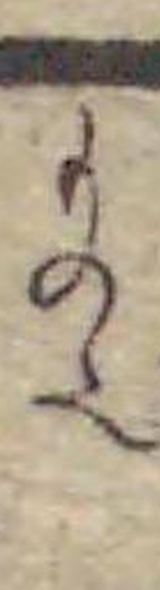もの也
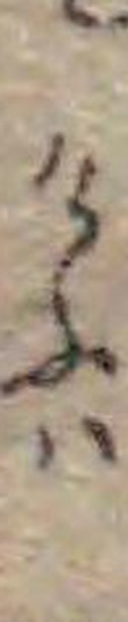けふは
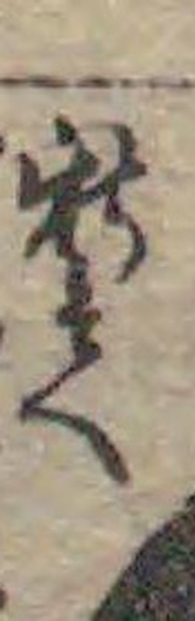新兵へ
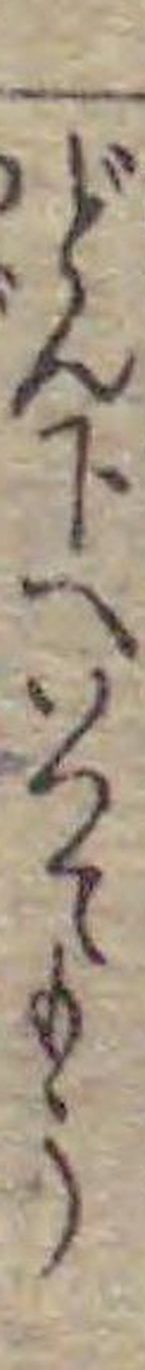どん下へいつてもう
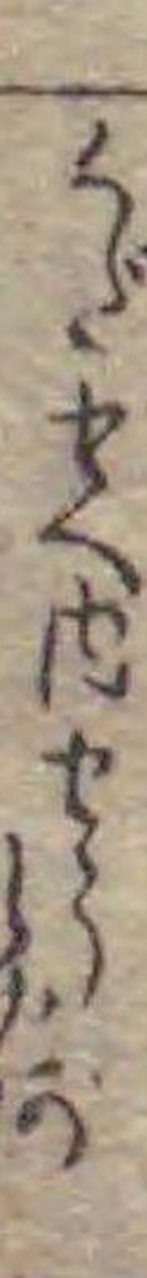くだせへ内せうしやあ

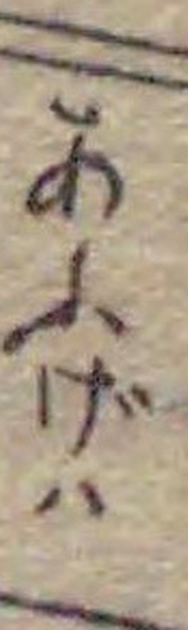あふげは
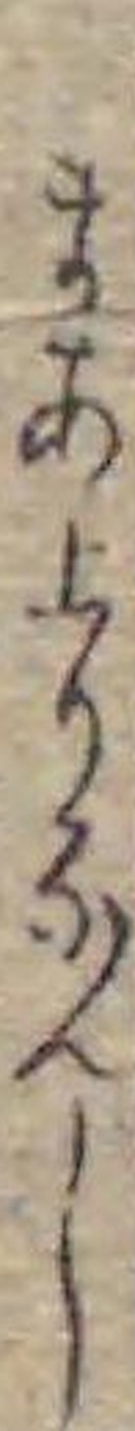まあ上りなんし
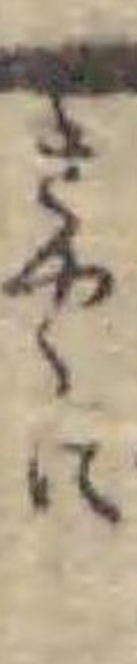きやくに
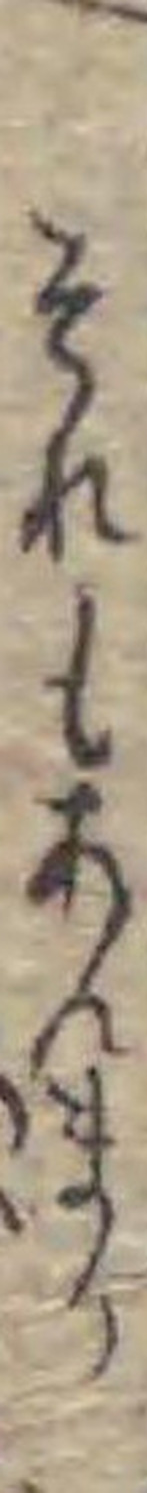それもあんまり
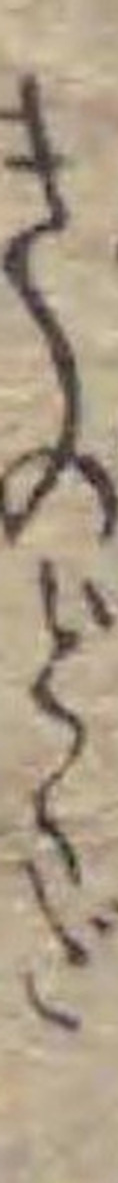きのどくだ
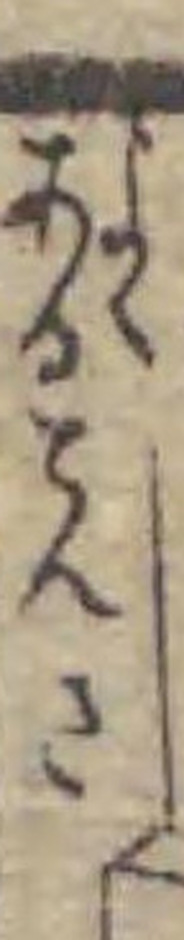あるとんさ
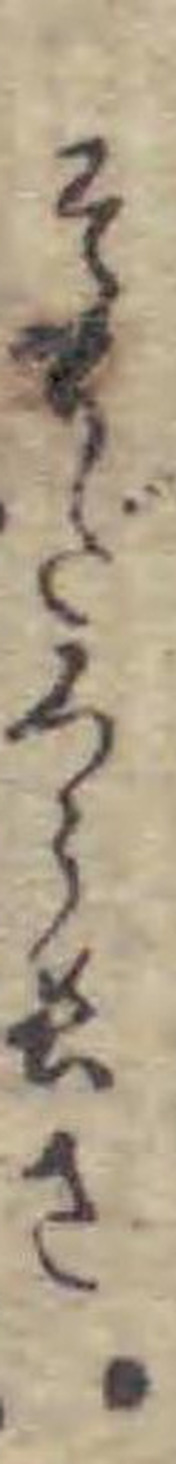そうだろう長さ
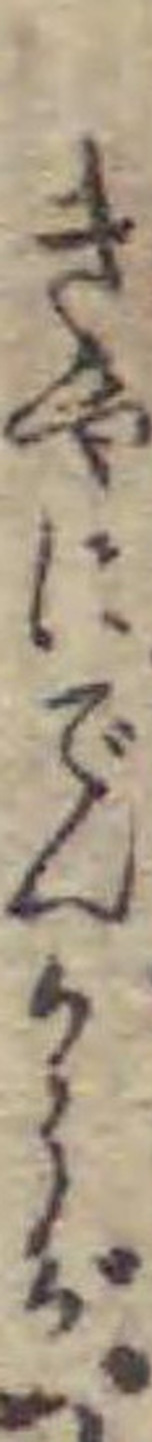きやにでんかうが
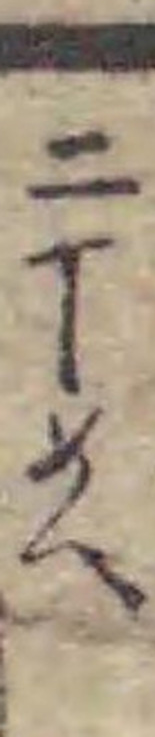二丁めへ
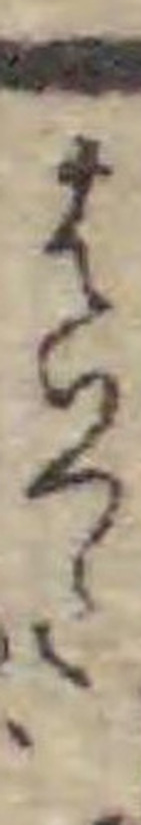はいつた
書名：江戸花俳優贔屓 : 3巻
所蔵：国立国会図書館 National Diet Library, JAPAN
